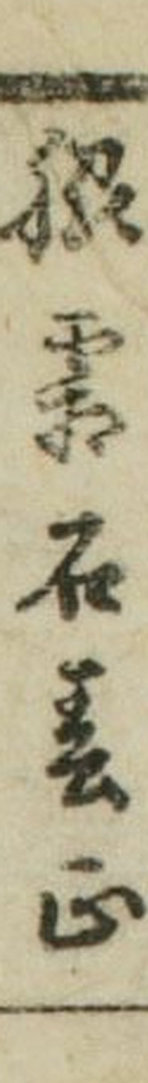脇霜石春正
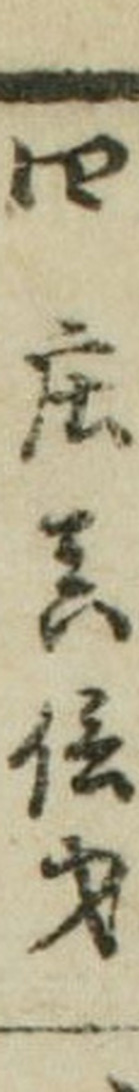四庄真信才
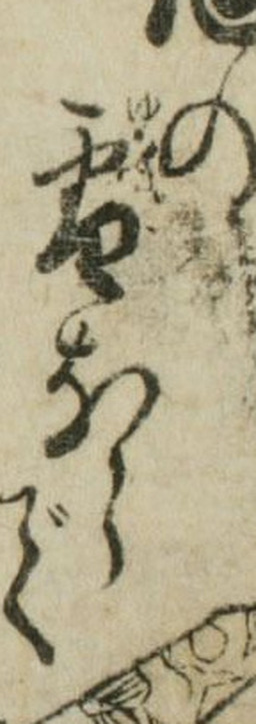雪ならで
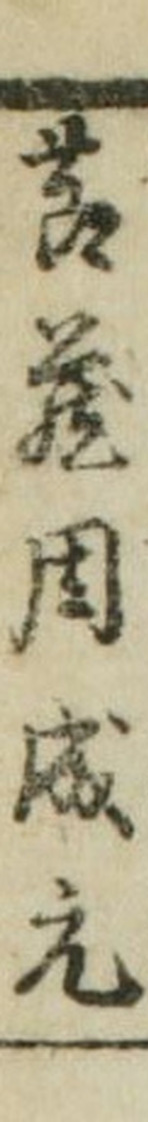節蔵周成元
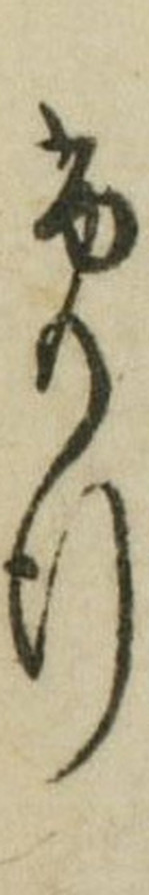ふり行
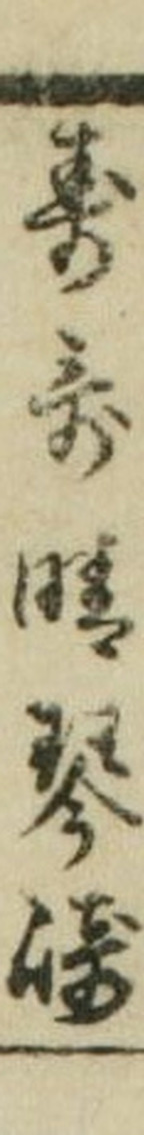寿哥晴琴崎
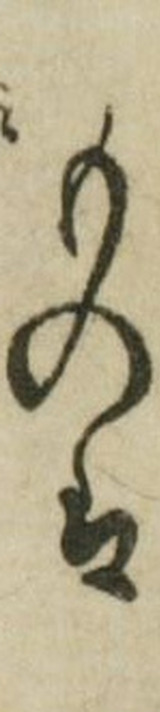ものは
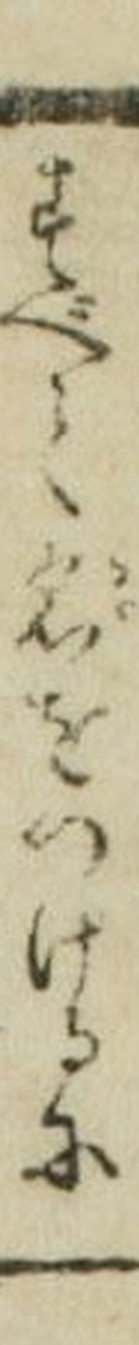すべて名をつけるに
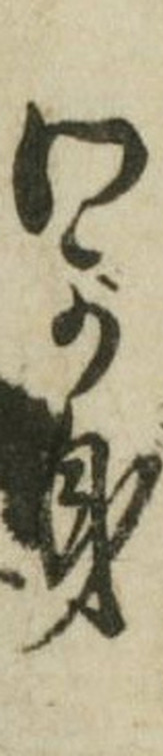わが身
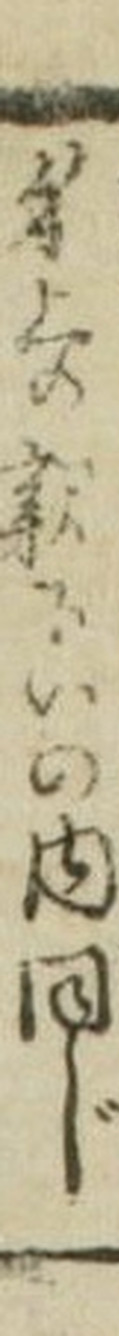身上の親るいの内同じ
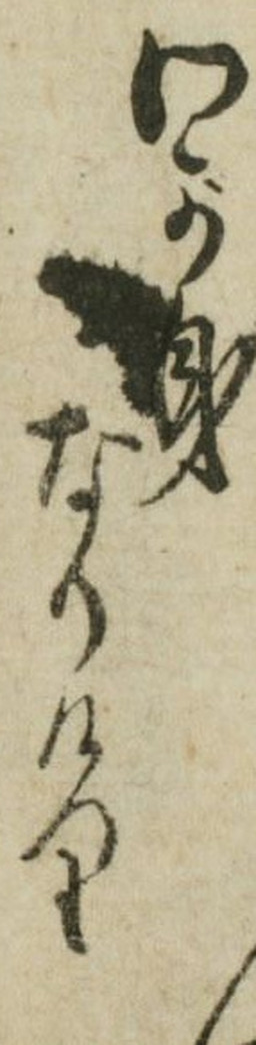なりけり
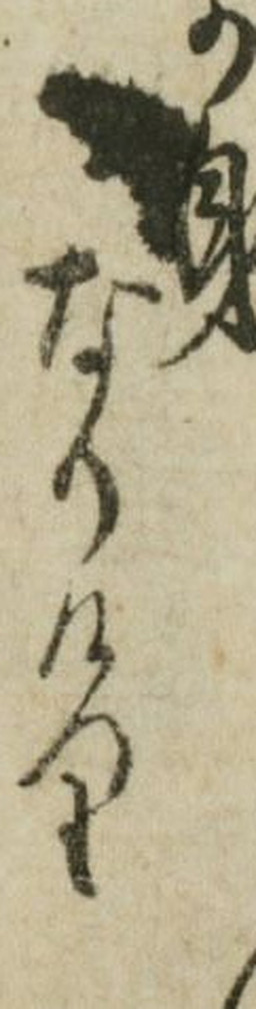なりけり
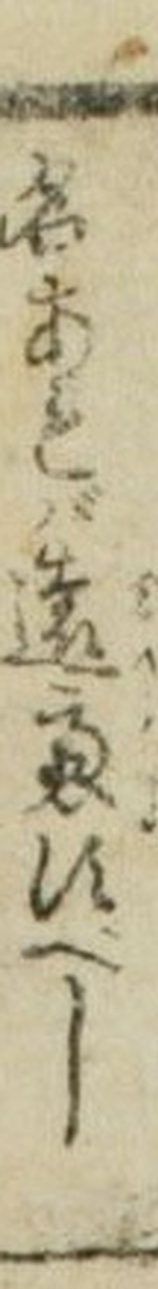名あれば遠慮すべし
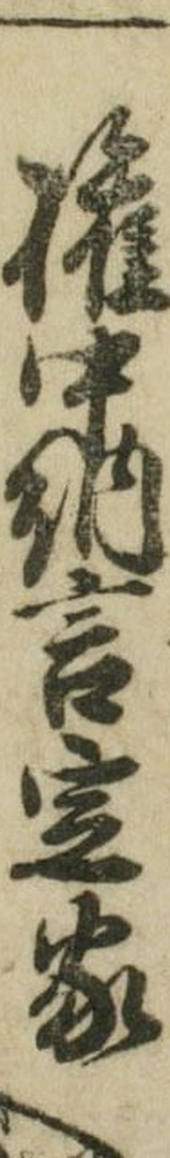権中納言定家
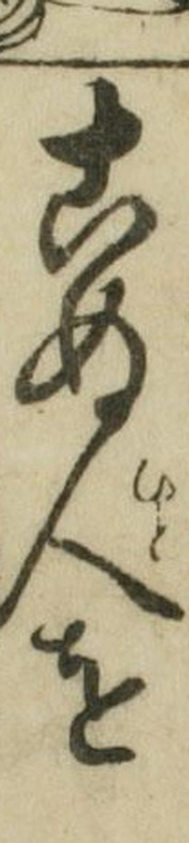こぬ人を
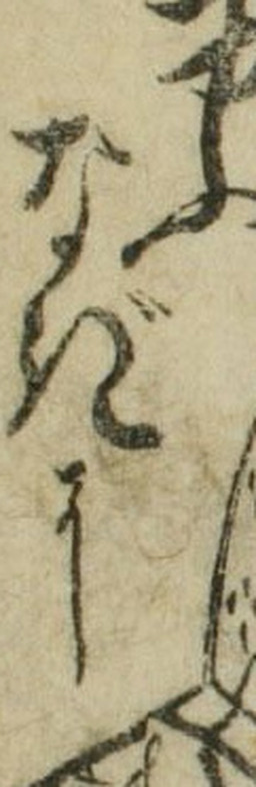なぎに
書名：百人一首
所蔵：東京学芸大学教育コンテンツアーカイブ
